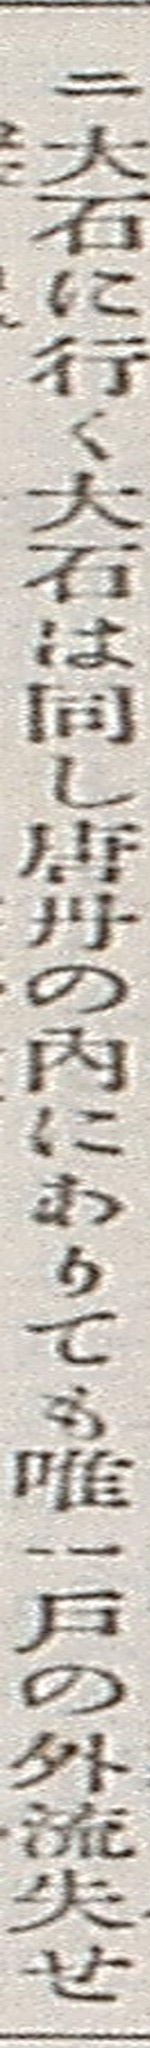ニ大石に行く大石は同し唐丹の内にありても唯一戸の外流失せ
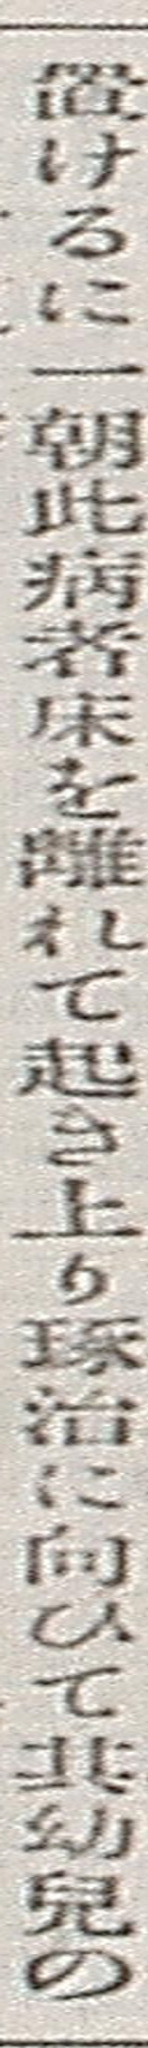置けるに一朝此病者床を離れて起き上り琢治に向ひて其幼兒の
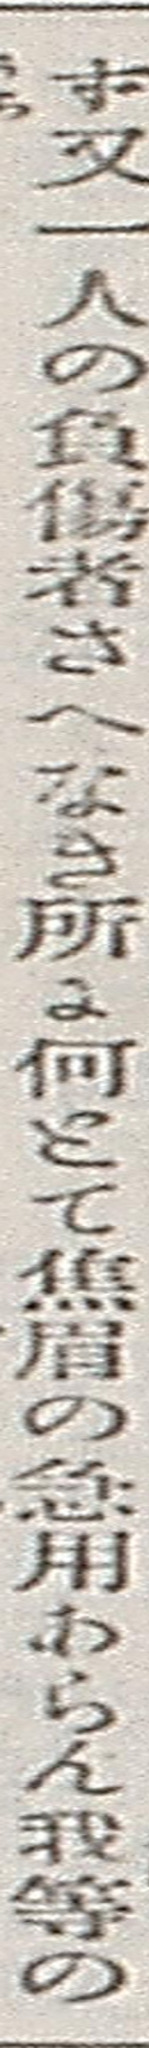ず又一人の負傷者さへなき所に何とて焦眉の急用あらん我等の
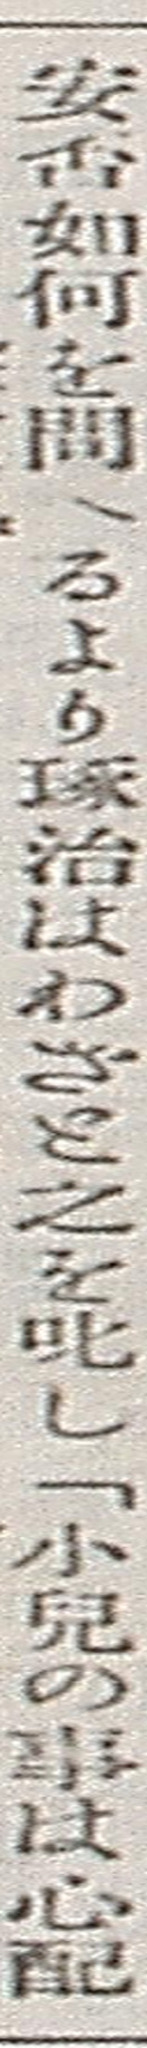安否如何を問へるより琢治はわざと之を叱し「小兒の事は心配
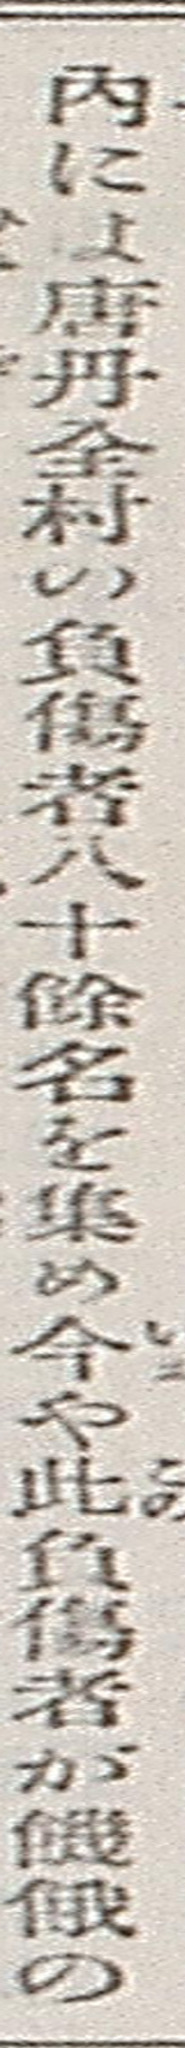内には唐丹全村の負傷者八十余人を集め今や此負傷者が飢餓の
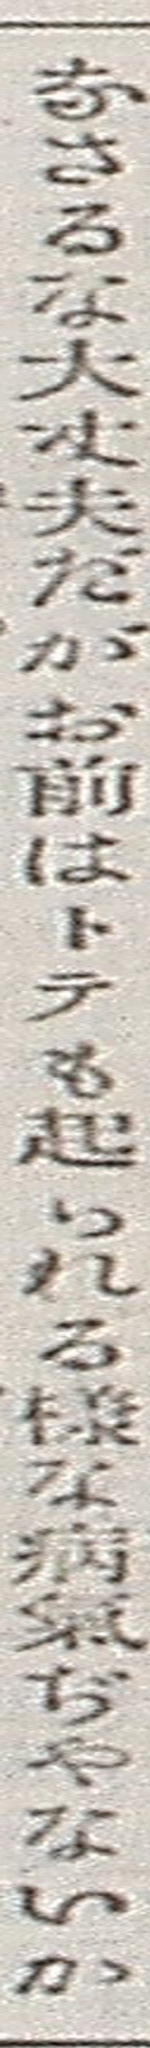なさるな大丈夫だがお前はトテも起られる様な病気ぢやないか
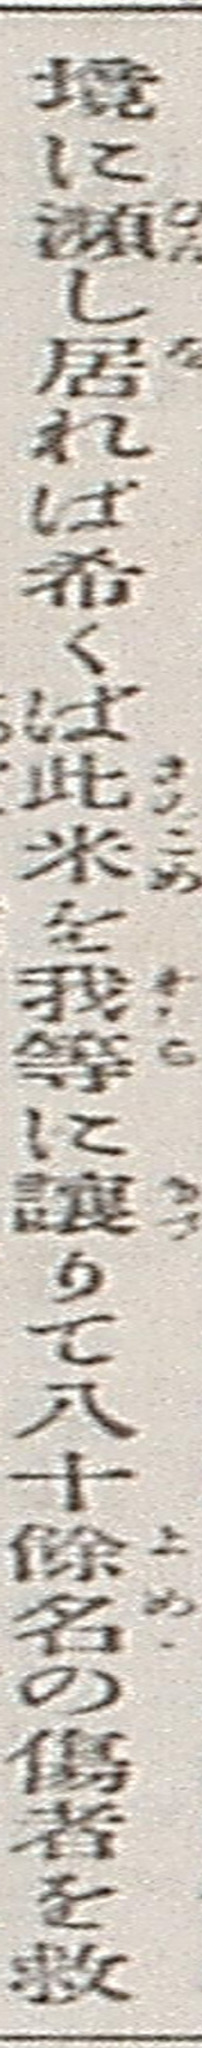境に瀕し居れば希くば此米を我等に譲りて八十余名傷者を救
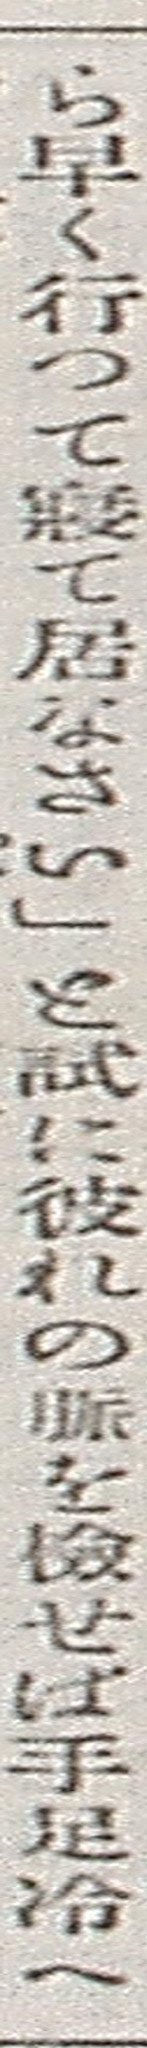ら早く行って寝て居なさい」と試験に彼れの脈を検せば手足冷へ
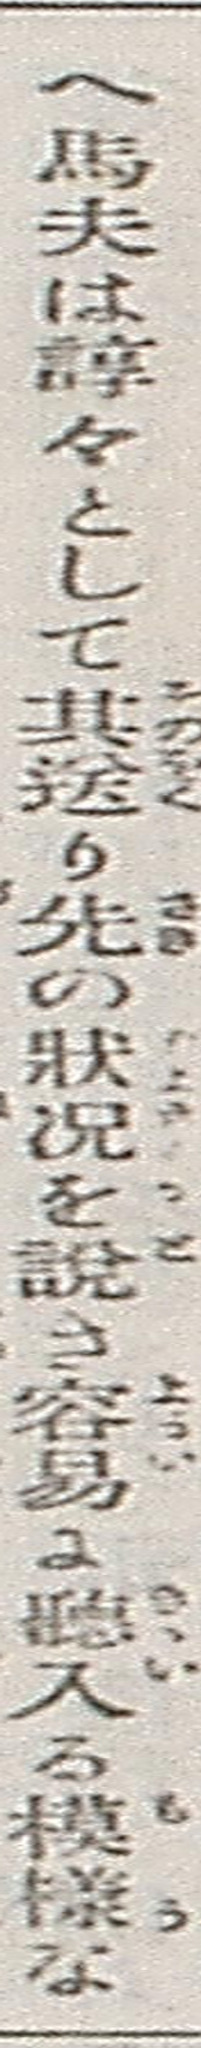へ馬夫は諄々として其送り先の状況を説き容易に聴入る模様な
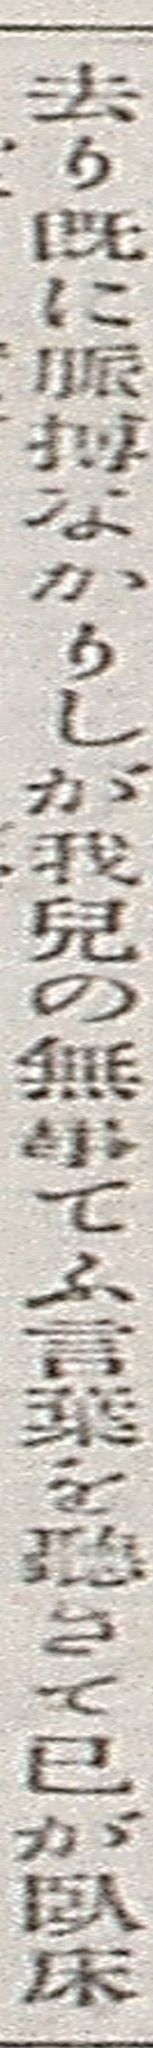去り既に脈搏なかりしが我兒の無事てふ言葉を聴きて己が臥床
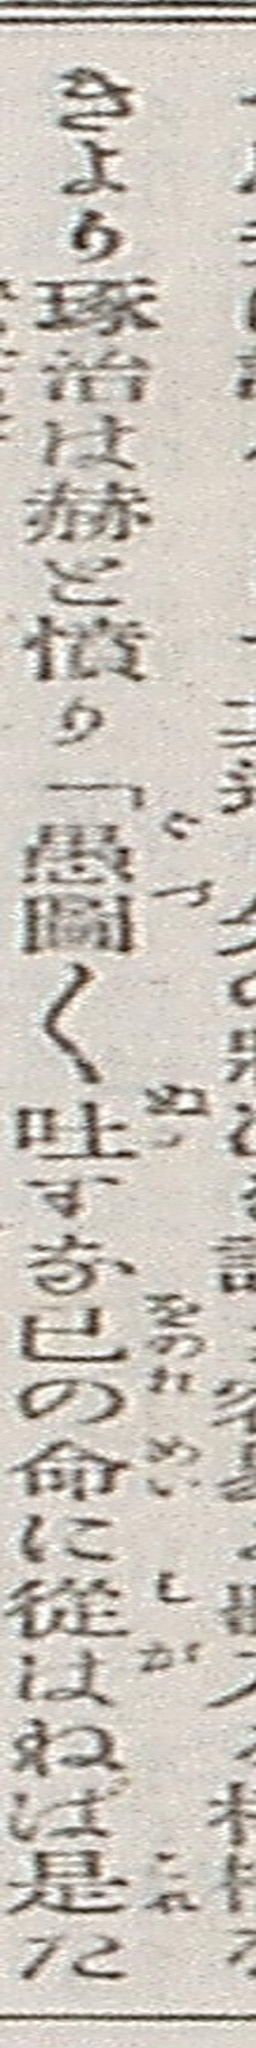きより琢治は赫と憤り「愚図〳〵吐すな己の命に従はねば是た
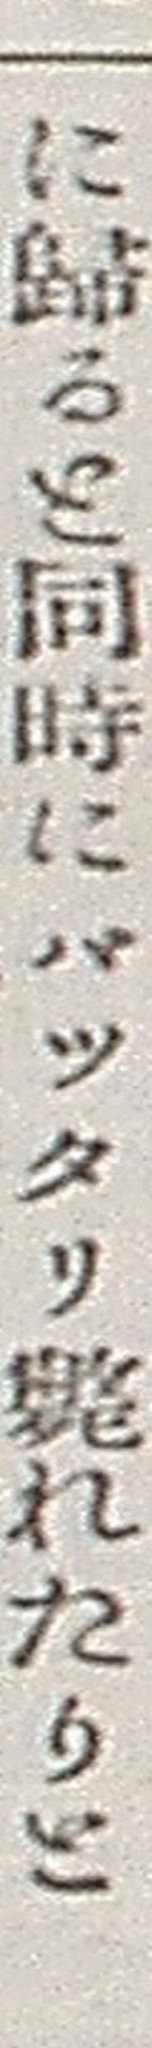に帰ると同時にバツタリ斃れたりと
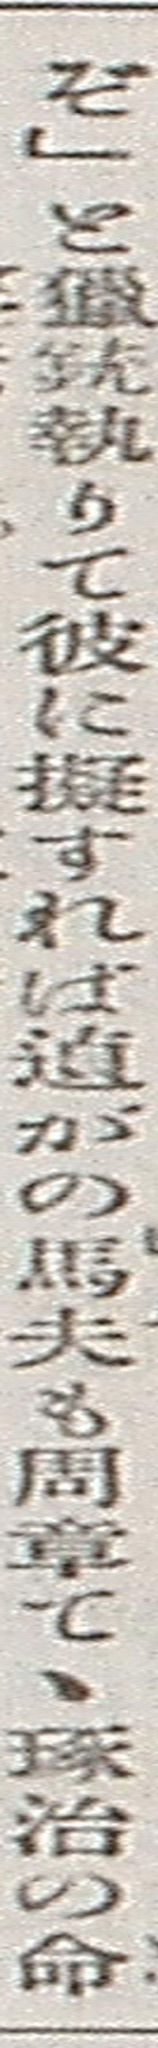ぞ」と猟銃執りて彼に擬すれば遉がの馬夫も周章てゝ琢治の命
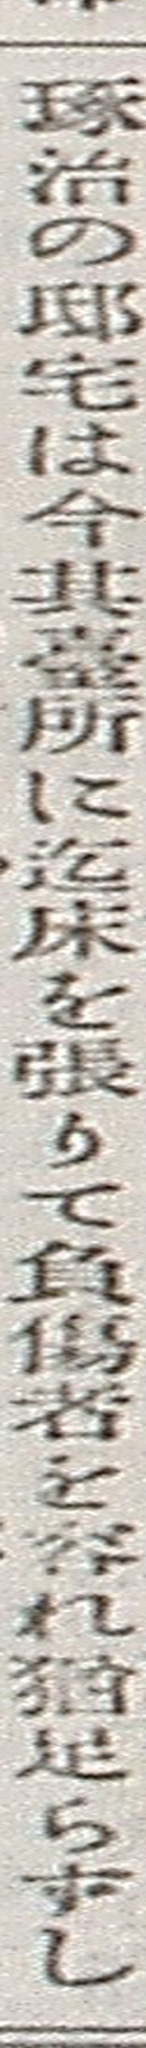琢治の邸宅は今其台所に迄床を張りて負傷者を容れ猶足らずし
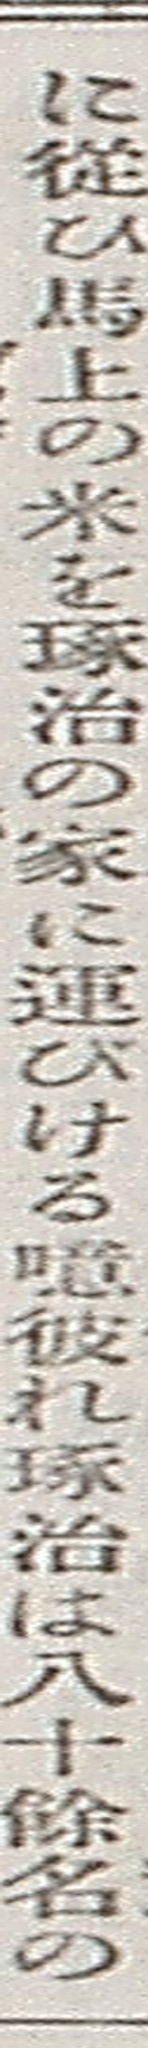に従ひ馬上の米を琢治の家に運びける噫彼れ琢治は八十余名の
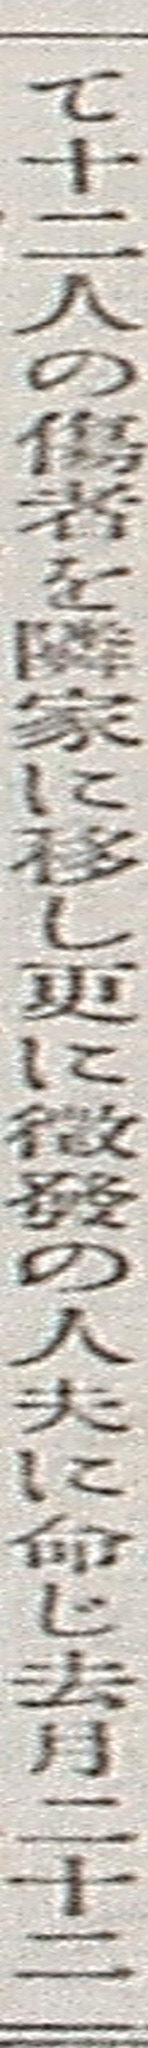て十二人の傷者を隣家に移し更に徴発の人夫に命じ去月二十二
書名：風俗畫報臨時増刊第百二十號　大海嘯被害録（下）
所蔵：東京大学地震研究所図書室 Earthquake Research Institute Library, The University of Tokyo, JAPAN
